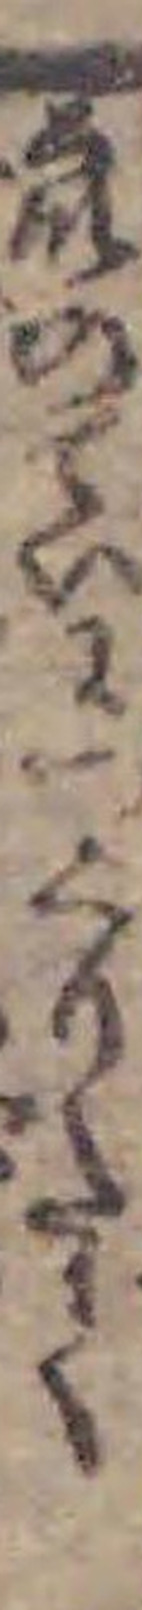衆のていにつくりたて
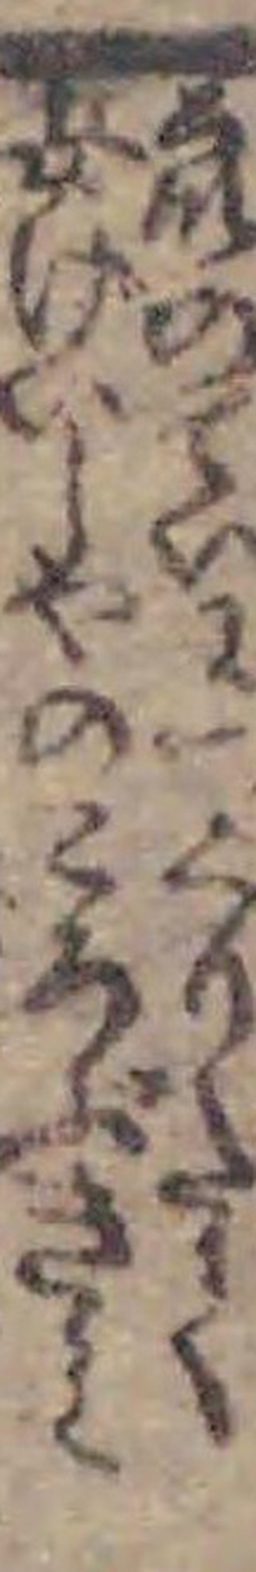女げいしやのころぶきみ
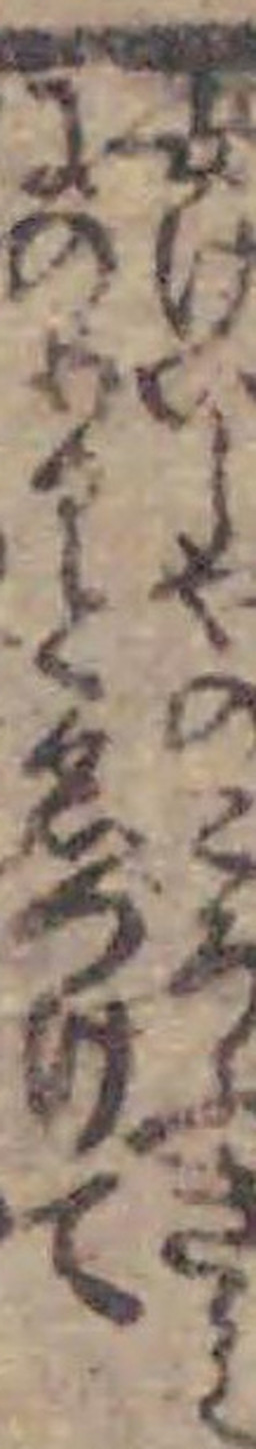にのめると名づけて
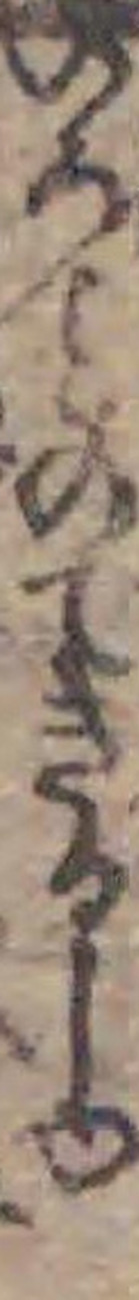いろことのできるしゆ
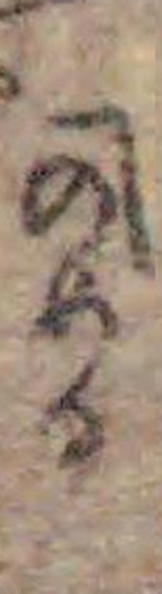〽のめる
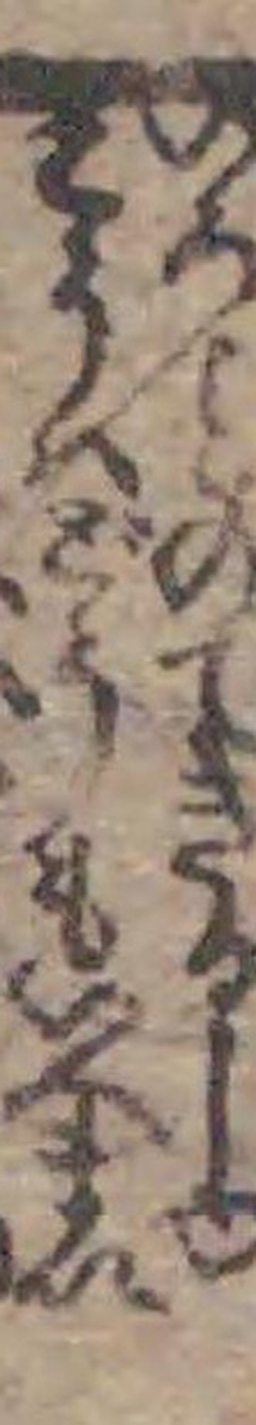こうはどうもいへまい
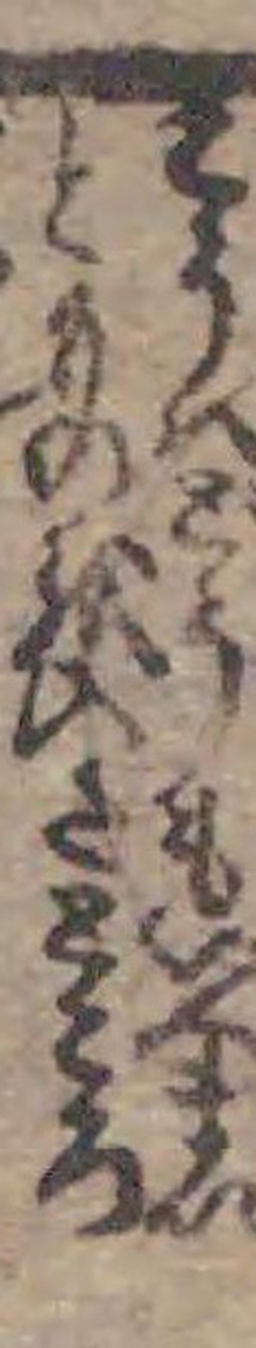とものを入たところ
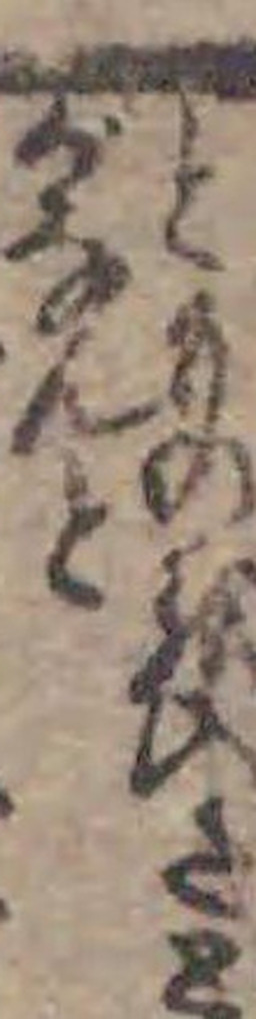がなんと
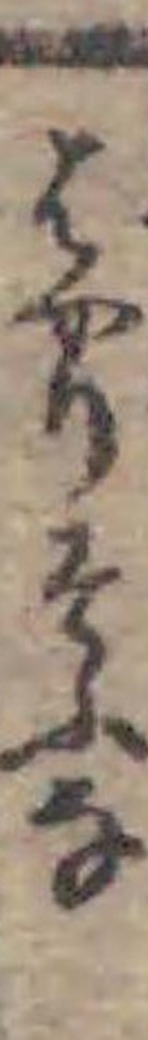はやりそふな
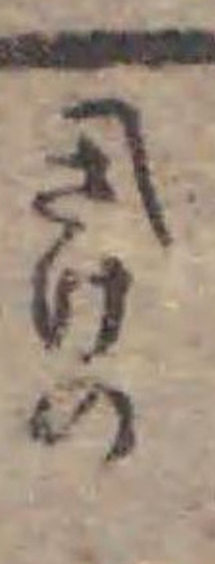〽さけの
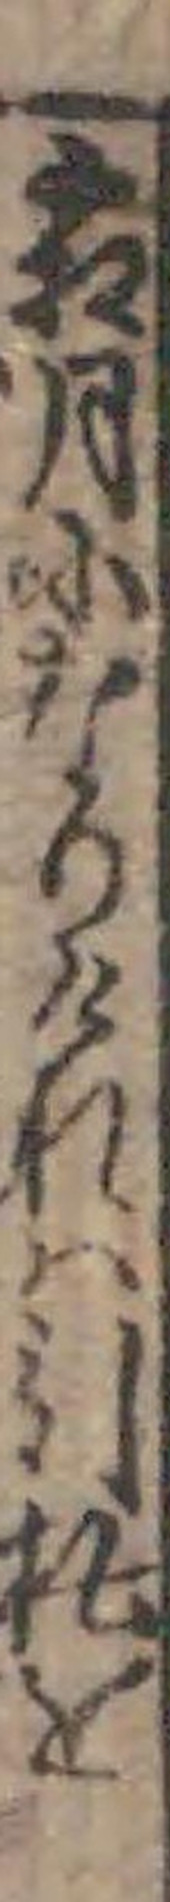霜月になりけれは引札を
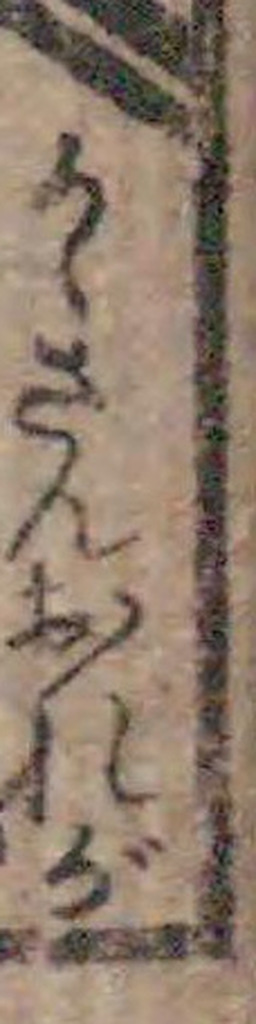かゝさんおれが
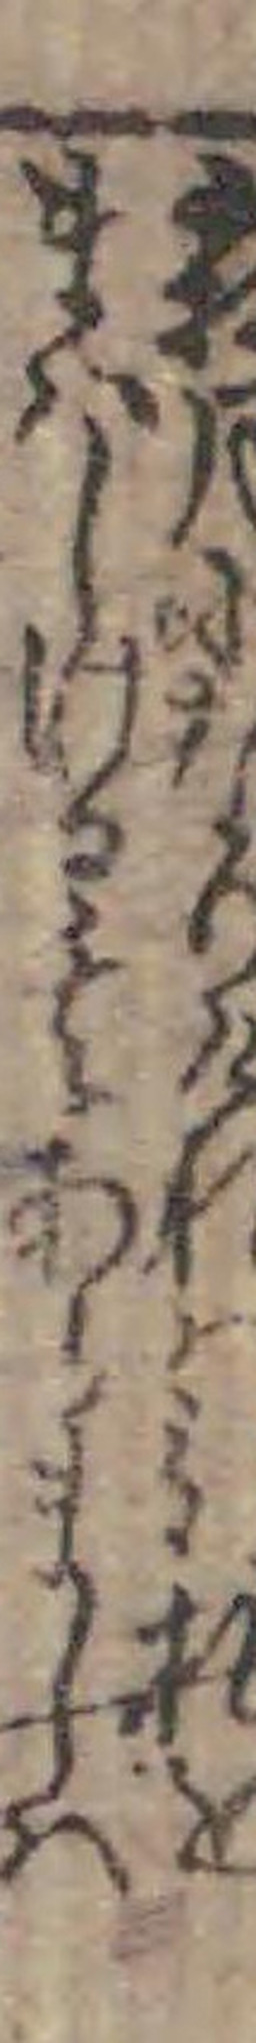まはしける其あらましは
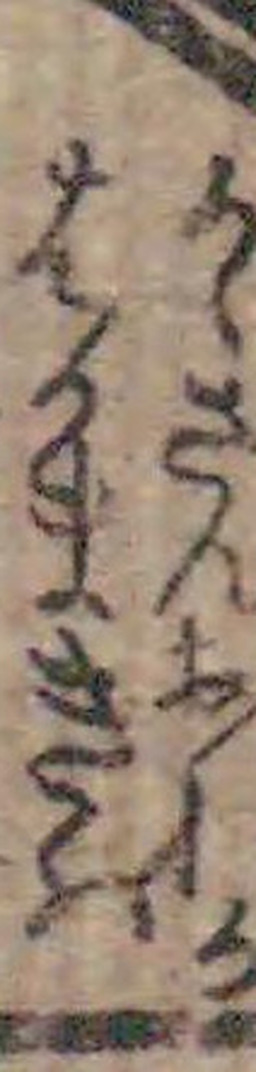はかまきは
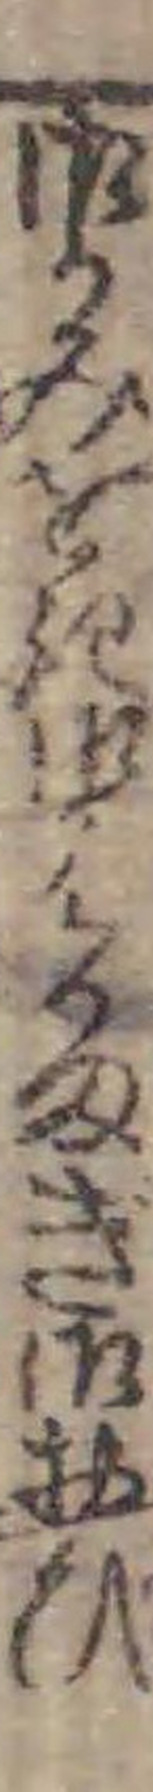御かみをき御はかまぎ御おひ
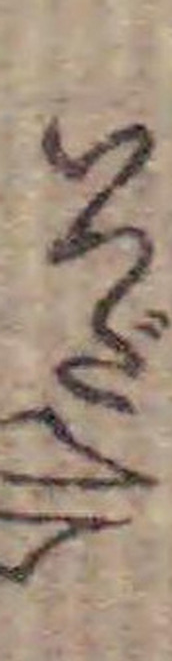いつだ
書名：本樹真猿浮気噺 : 3巻
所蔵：国立国会図書館 National Diet Library, JAPAN
